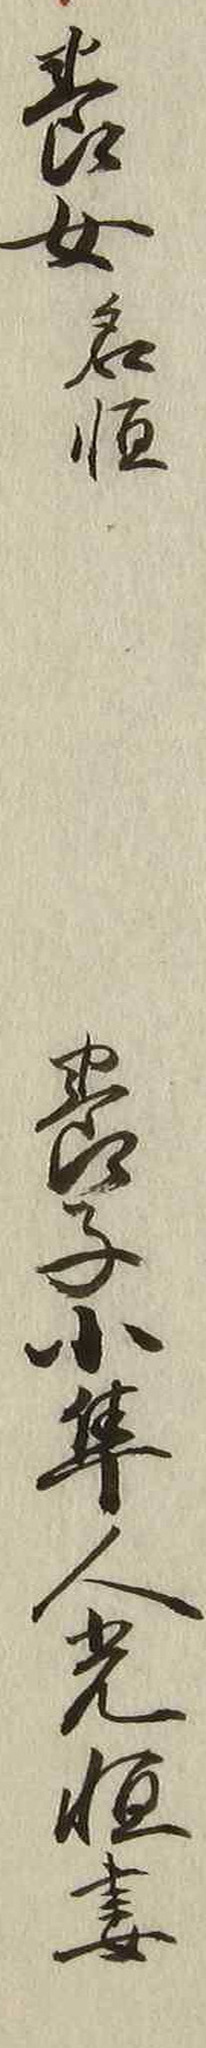養女名恒養子小隼人光恒妻
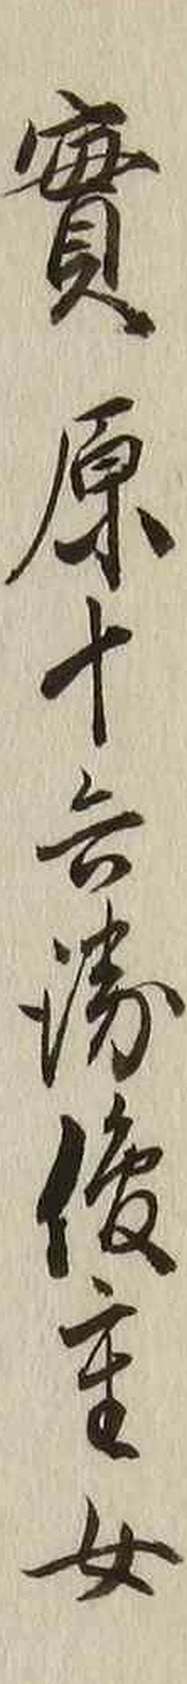実原十兵衛俊重女
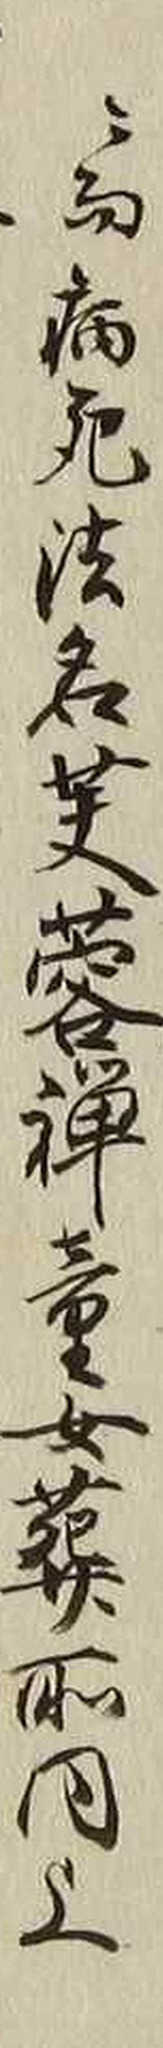ニ而病死法名芙蓉禅童女葬所同上
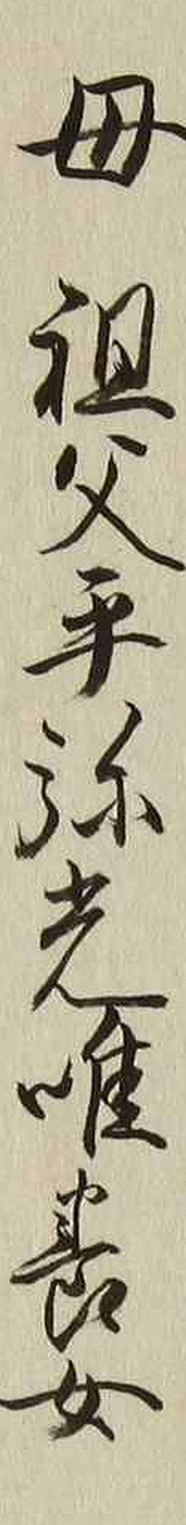母祖父平弥光唯養女
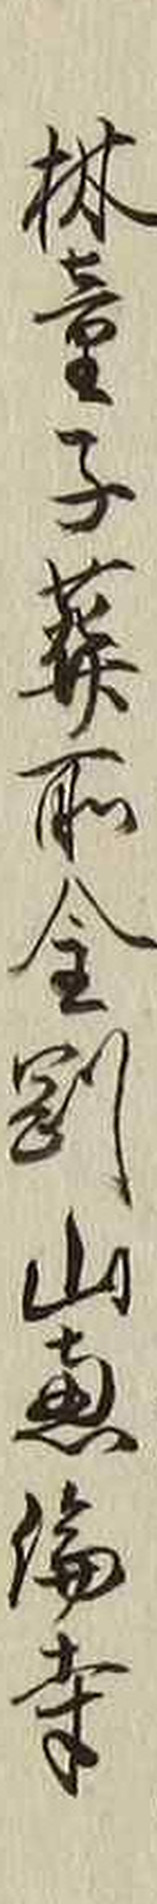林童子葬所金剛山恵倫寺
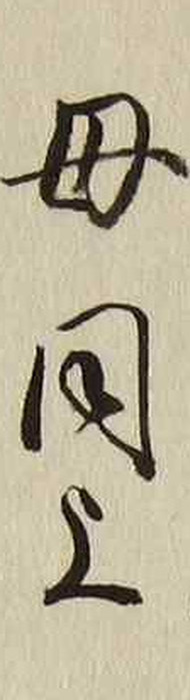母同上
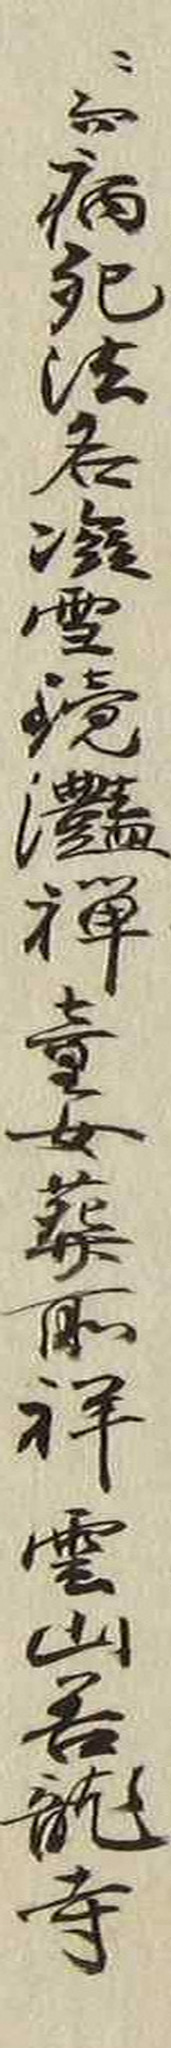ニ而病死法名滋雪鏡灎禅童女葬所祥雲山善龍寺
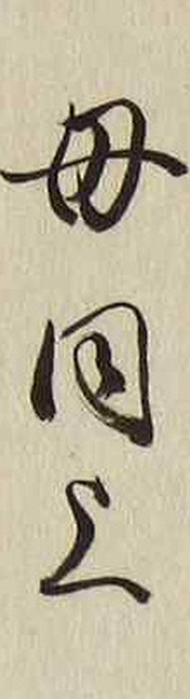母同上

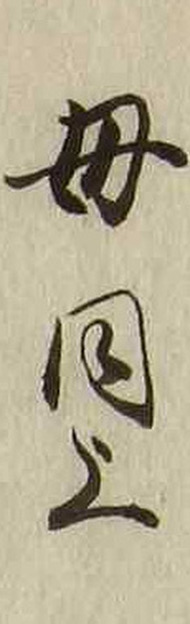母同上
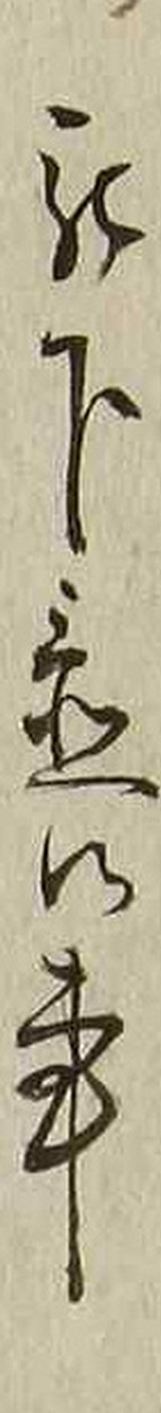被下置候事
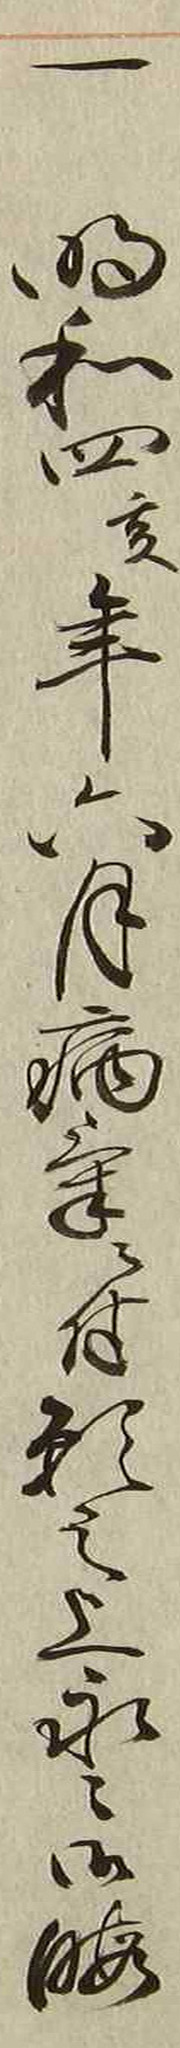一明和四亥年六月病気ニ付願之上永々御暇
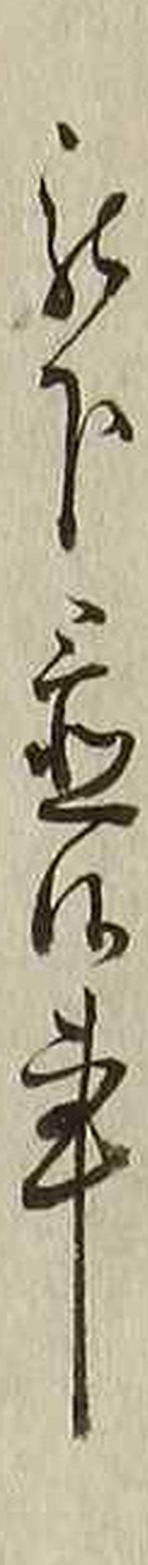被下置候事
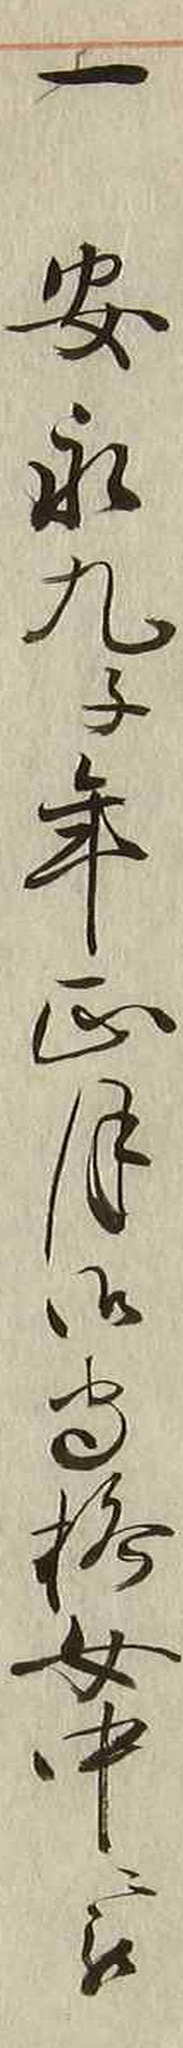一安永九子年正月御守格女中ニ被
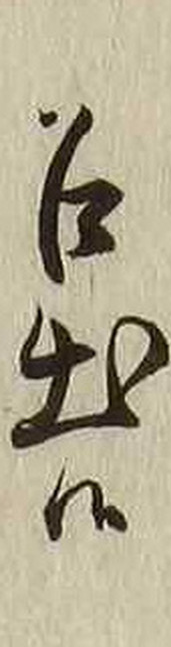召出候
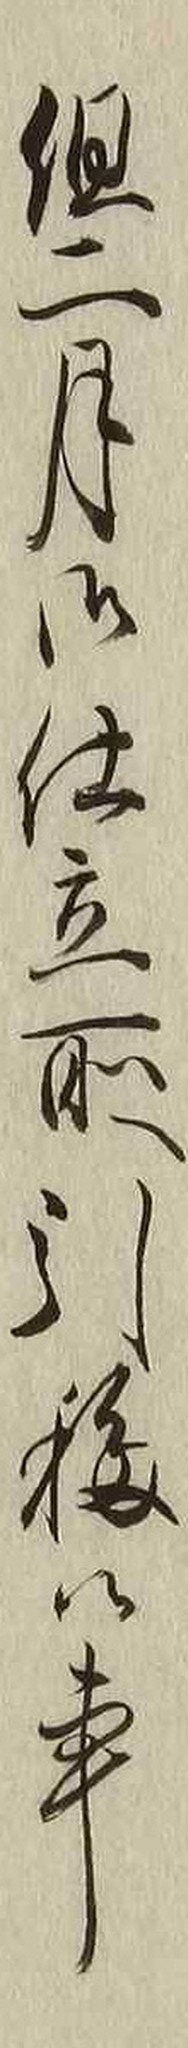但二月御仕立所へ引移候事
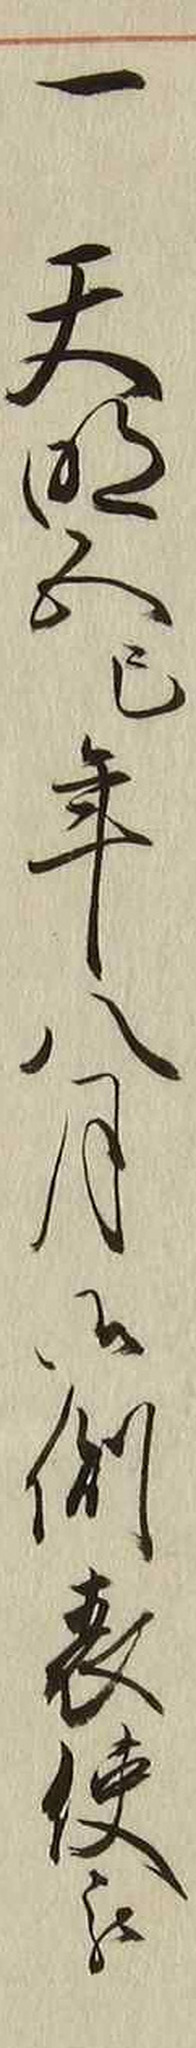一天明五巳年八月御側表使被
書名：諸士系譜　巻之21　い之部21
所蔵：会津若松市立会津図書館
